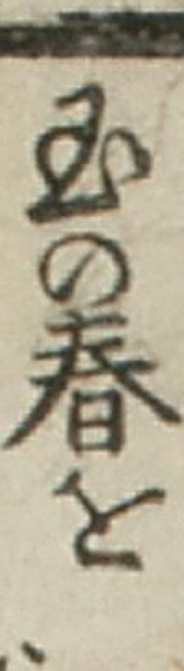玉の春を
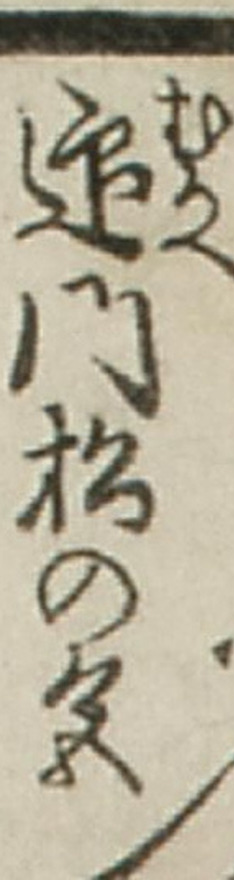迎門松の色
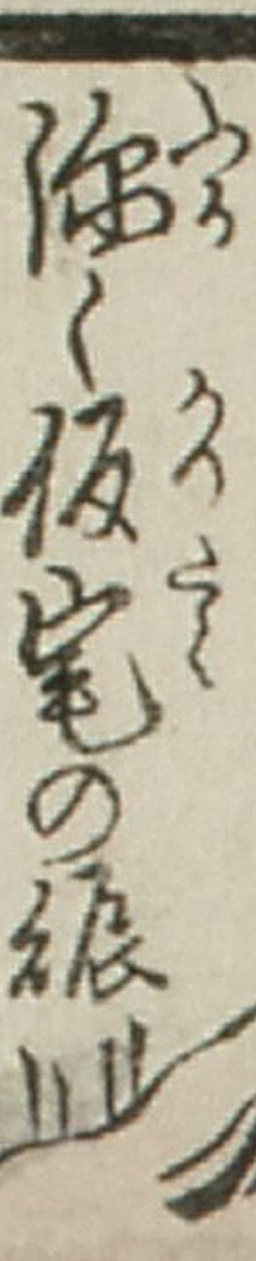深く仮宅の賑
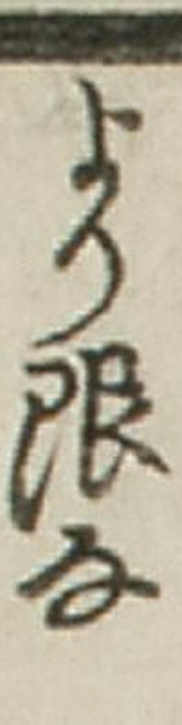より限な
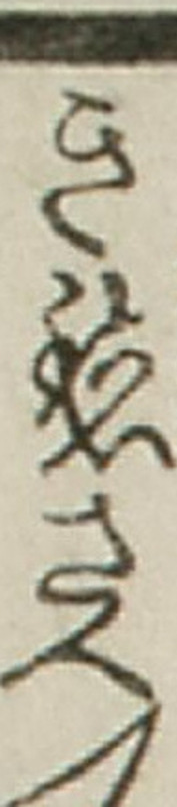き愁さへ
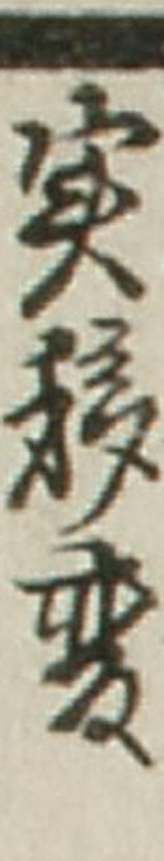実移変
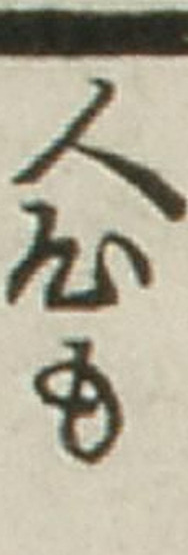人心も

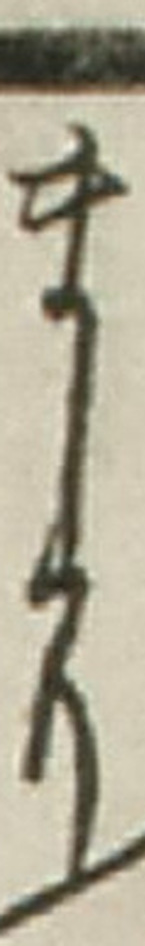ましに
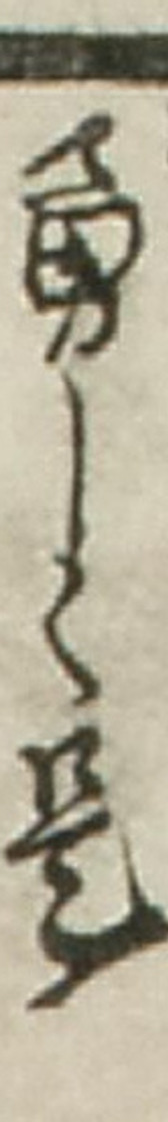勇しく是
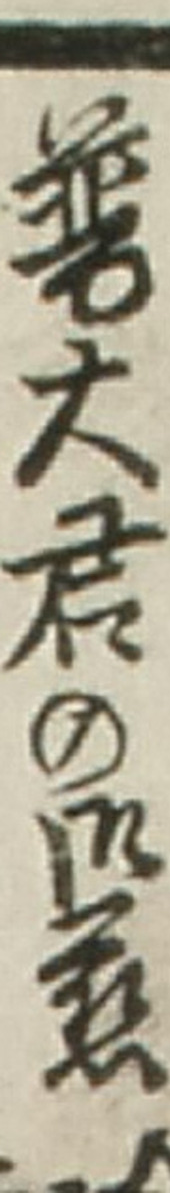普大君の御慈
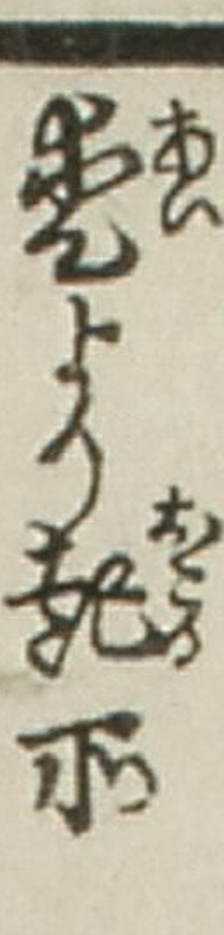愛より起所
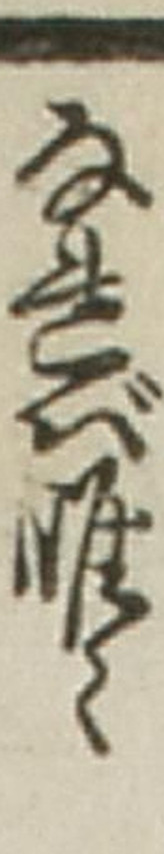なれば唯〻
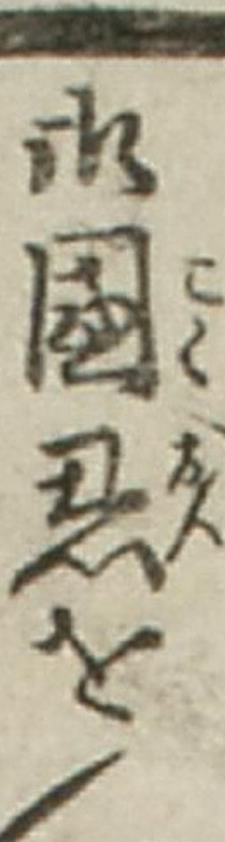御国恩を
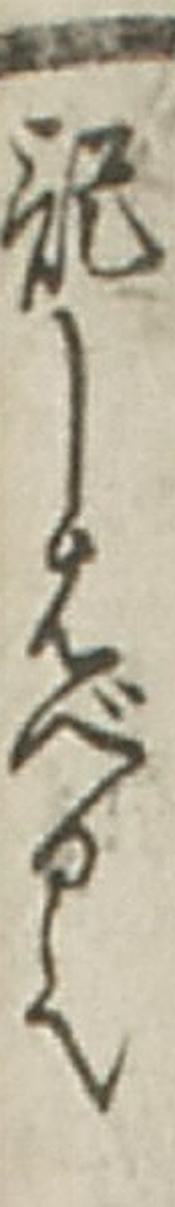記しはべる也
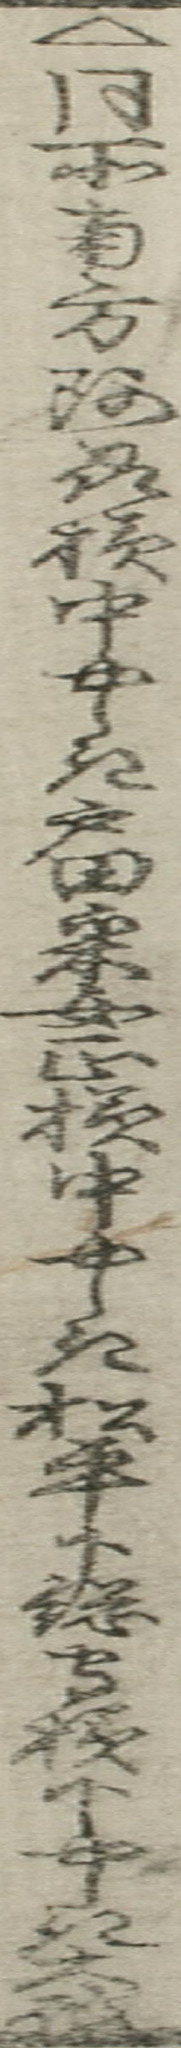△同所南方阿州様中やしき戸田采女正様中やしき松平下総守様下やしき大破
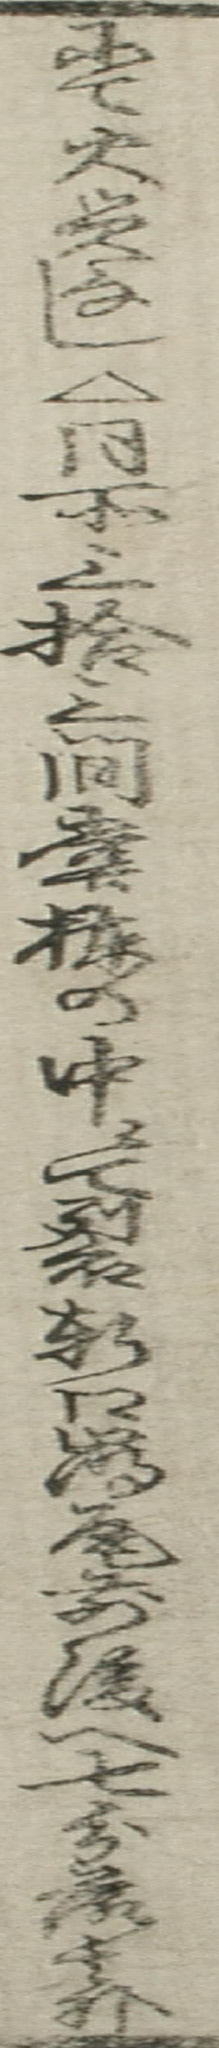にて火災なし△同所三拾三間堂様の中にて裂軒口崩瓦前後へ七分落其外
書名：安政見聞誌　上
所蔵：東京大学地震研究所図書室 Earthquake Research Institute Library, The University of Tokyo, JAPAN
